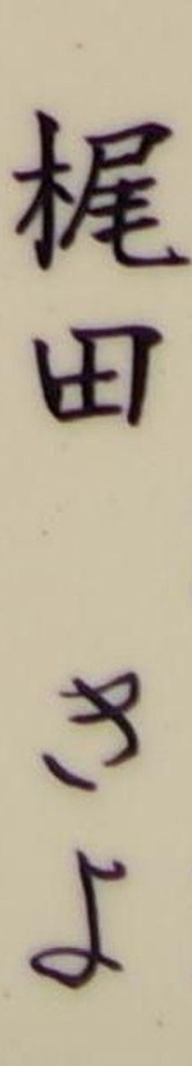梶田きよ
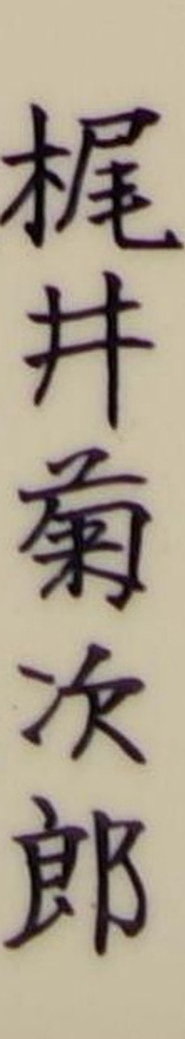梶井菊次郎
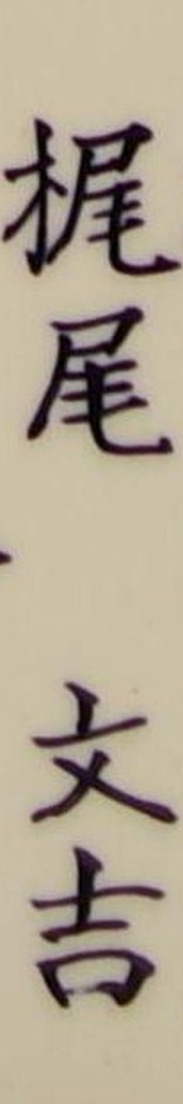梶尾文吉
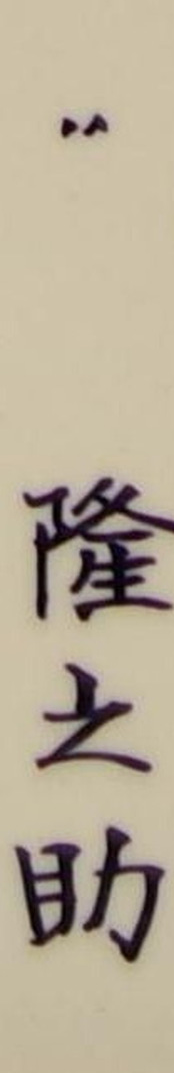隆之助
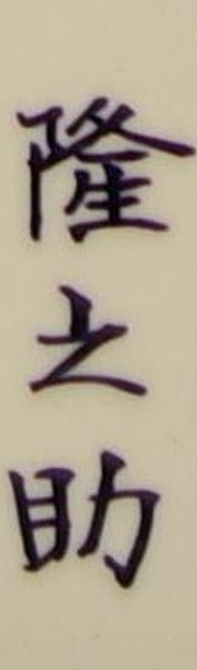隆之助
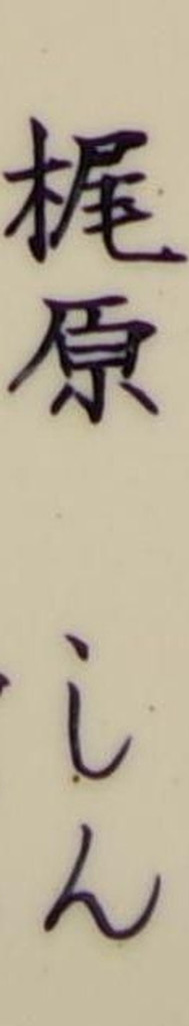梶原しん
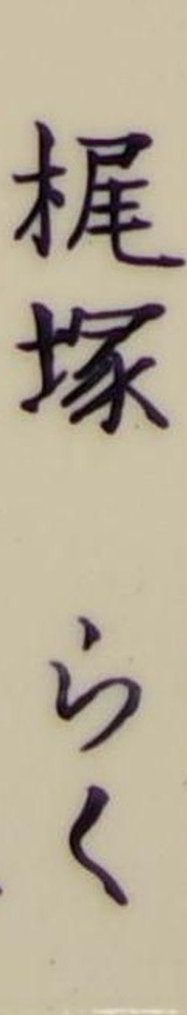梶塚らく
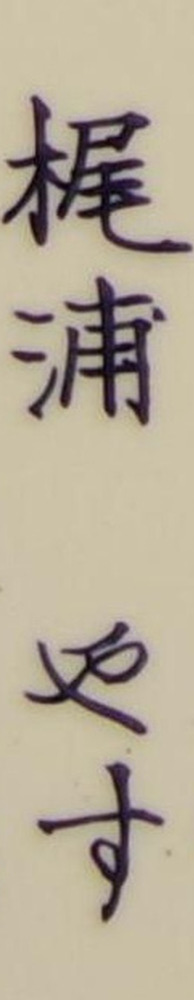梶浦やす
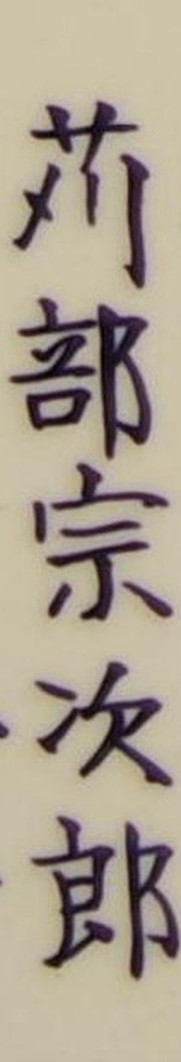苅部宗次郎
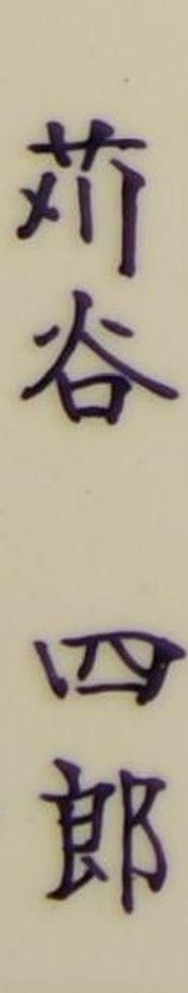苅谷四郎

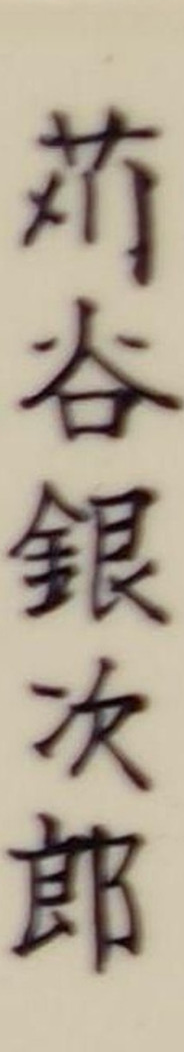苅谷銀次郎
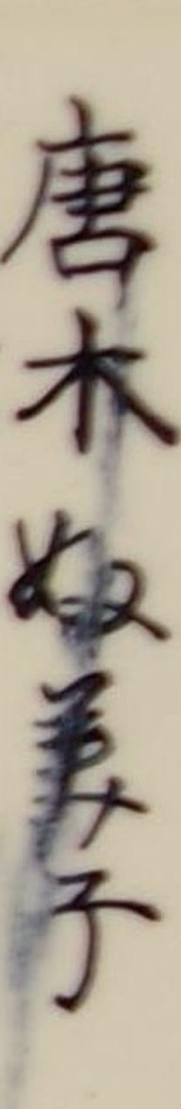唐木ふみ子
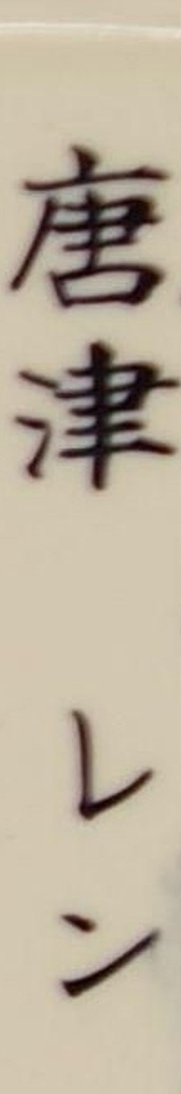唐津レン
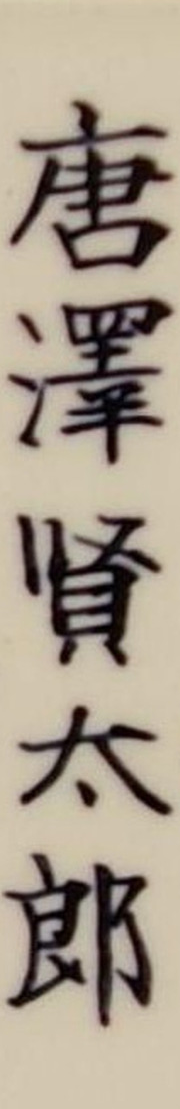唐澤賢太郎
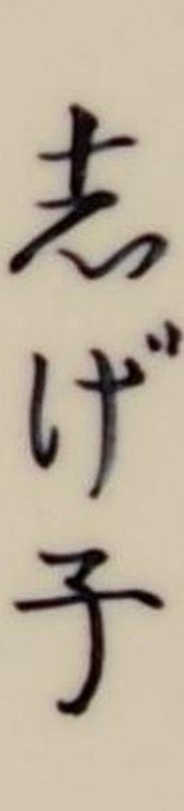しげ子
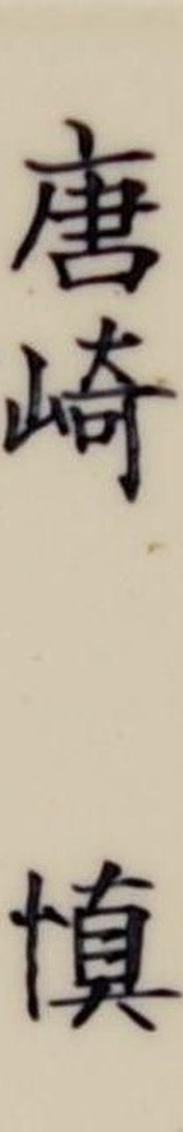唐崎慎
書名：E~L
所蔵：高野山金剛峯寺
